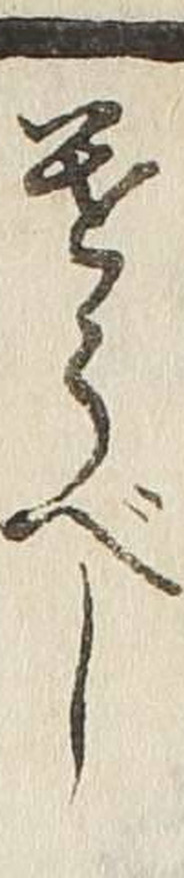遣うべし
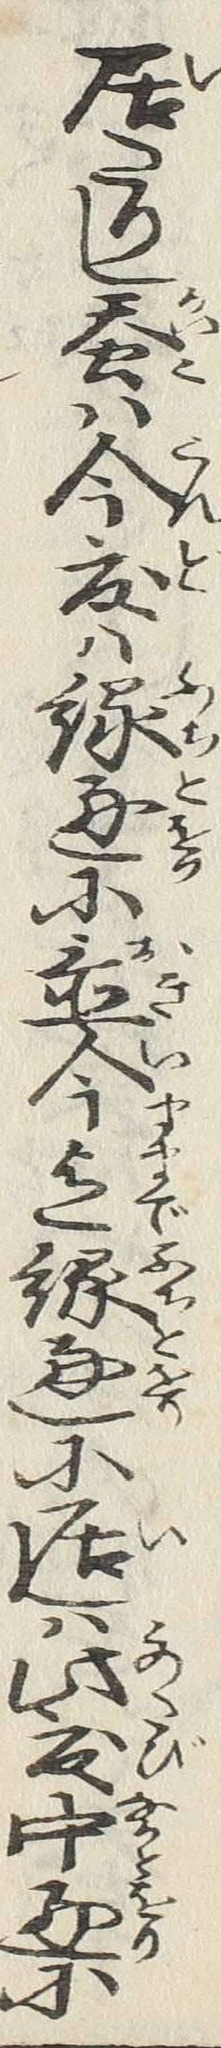居たりし蚕は今度は縁通に置今迄縁通に居しは此度中通に
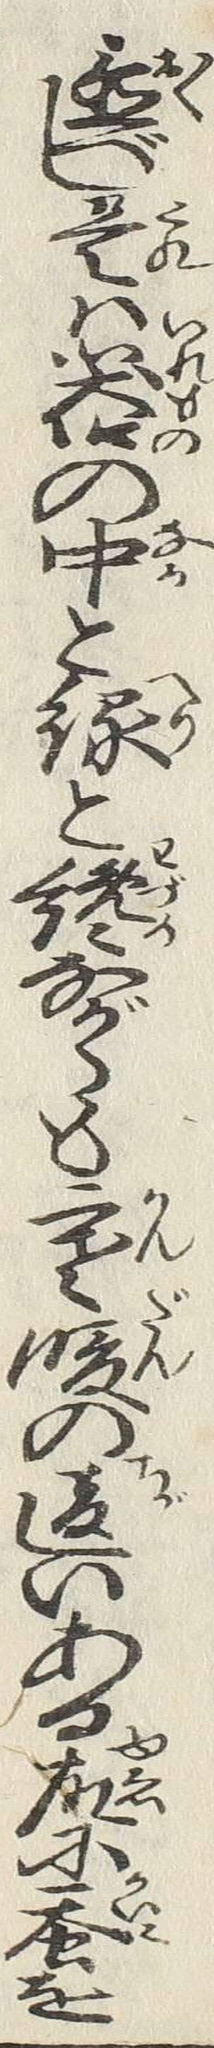置べし是は器の中と縁と纔ながらも寒暖の違いある故に蚕を
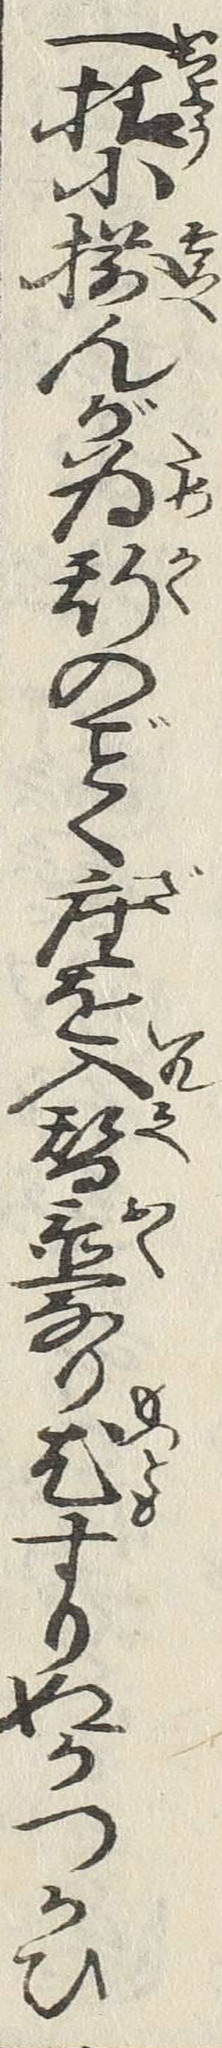一様に揃んが為斯のごとく座を入替置なり尤すりぬかつかひ
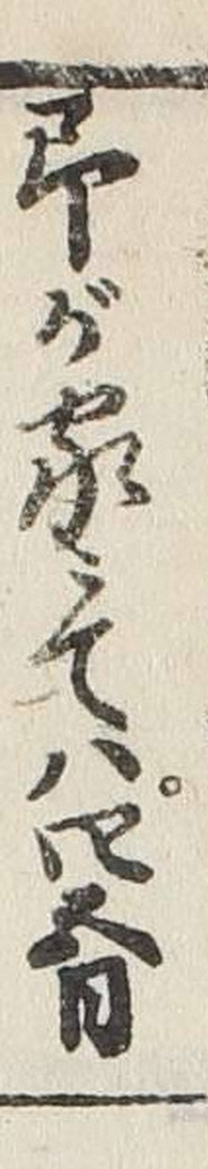予が家にては。四五日
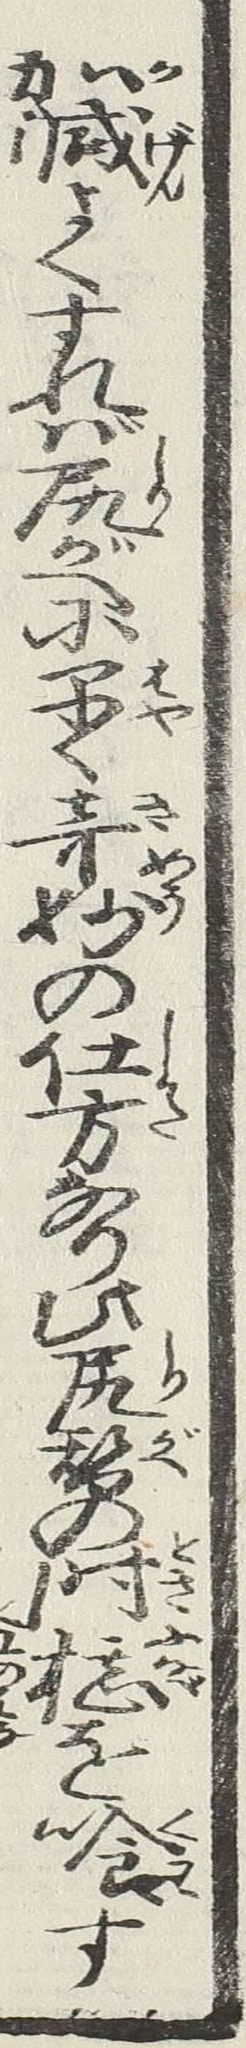加減よくすれば尻がへに早く奇妙の仕方なり此尻替の時椹を喰す
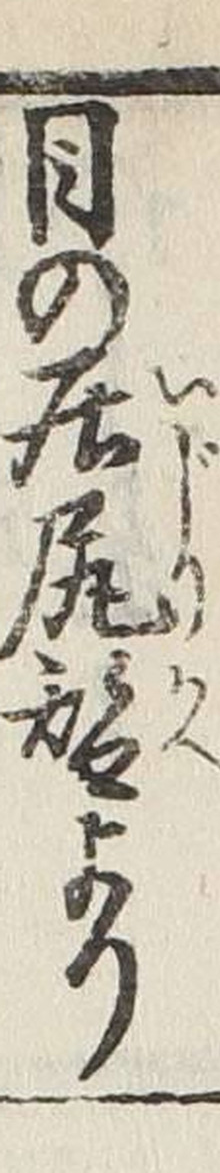目の居尻替より
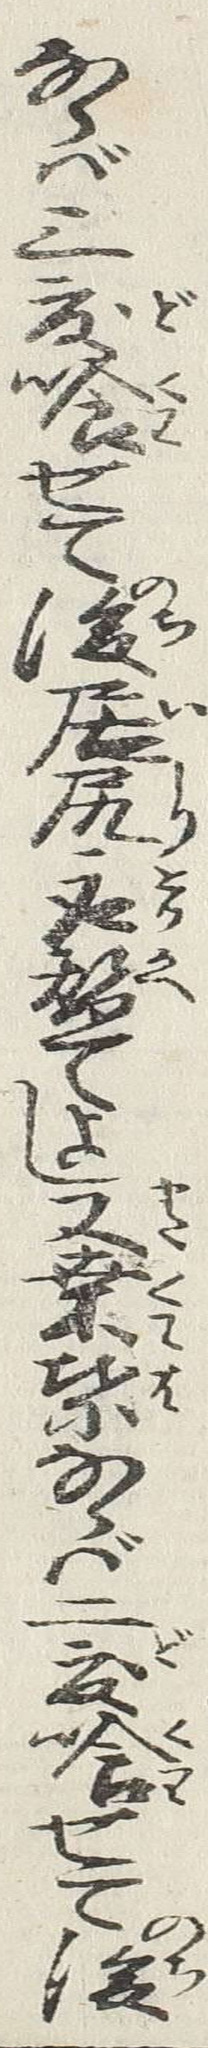ならば三度喰せて後居尻取替てよし又桑葉ならば二度喰せて後
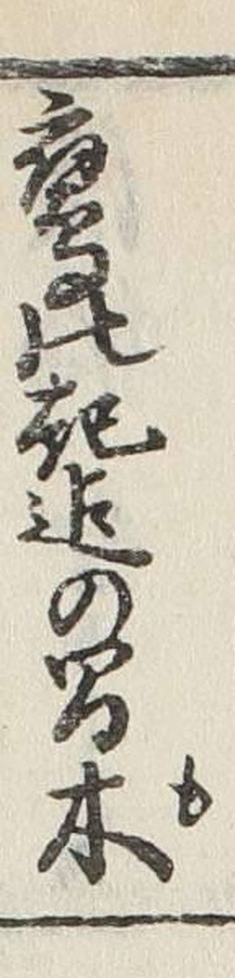鷹の起迄の間木
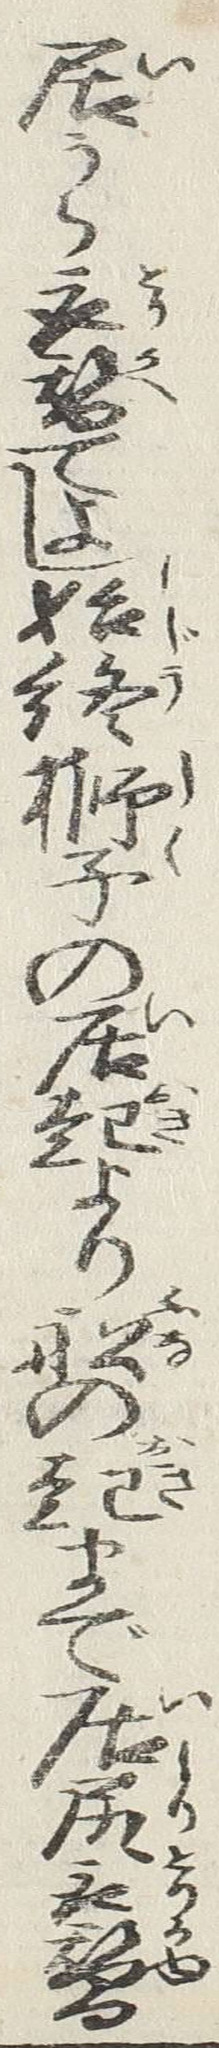居うら取替てよし始終獅子の居起より舩の起まで居尻取替る
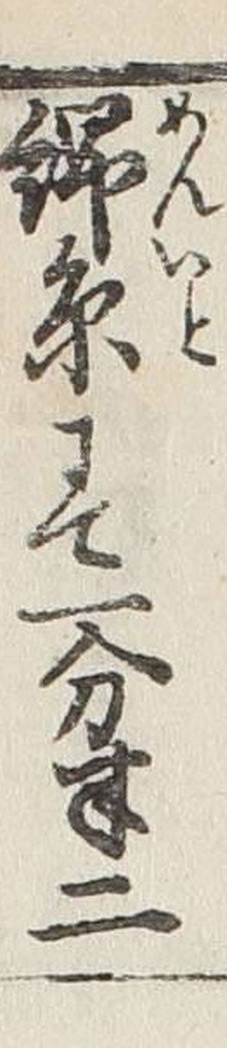綿糸にて一分半二
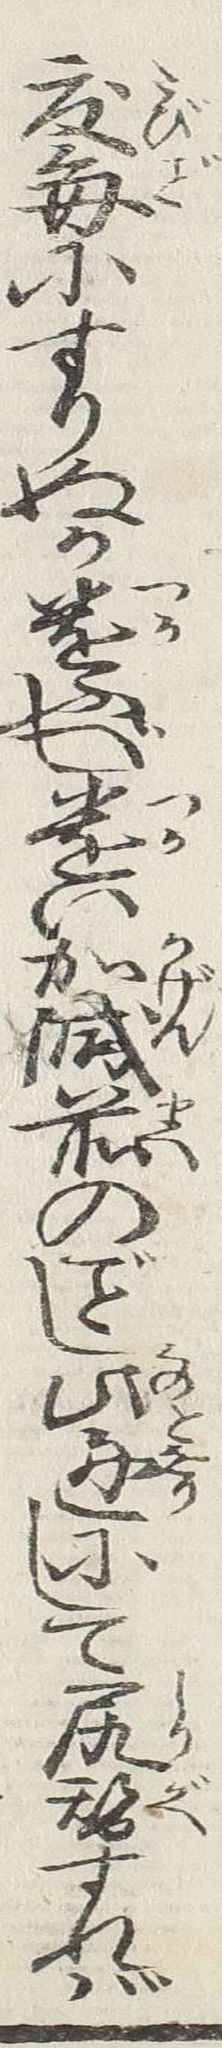度毎にすりぬか遣ふべし遣い加減前のごとし此通にして尻替すれば
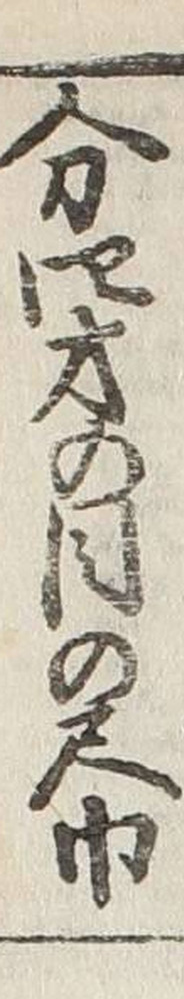分四方の目の尺巾
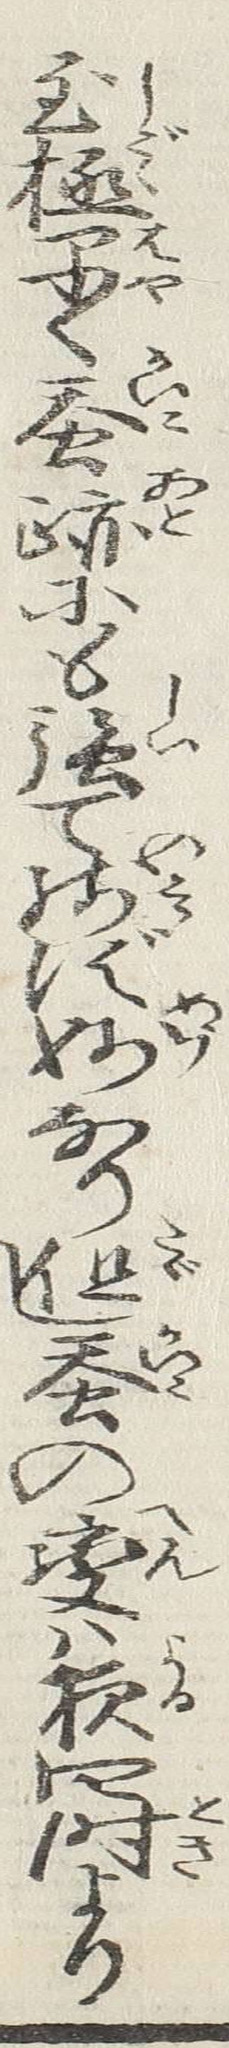至極早く蚕跡にも強て残ず妙なり但し蚕の變は夜四時より
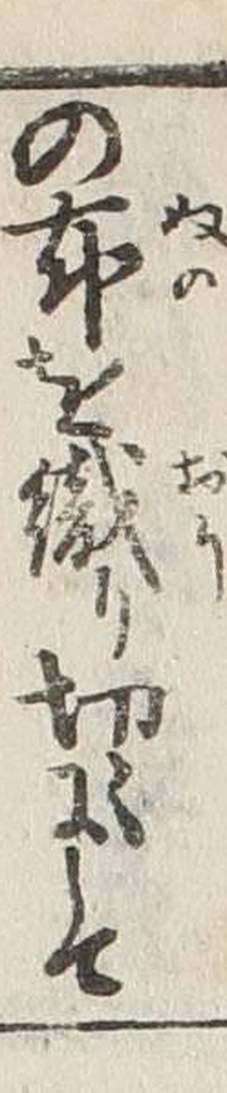の布を織り切々にして
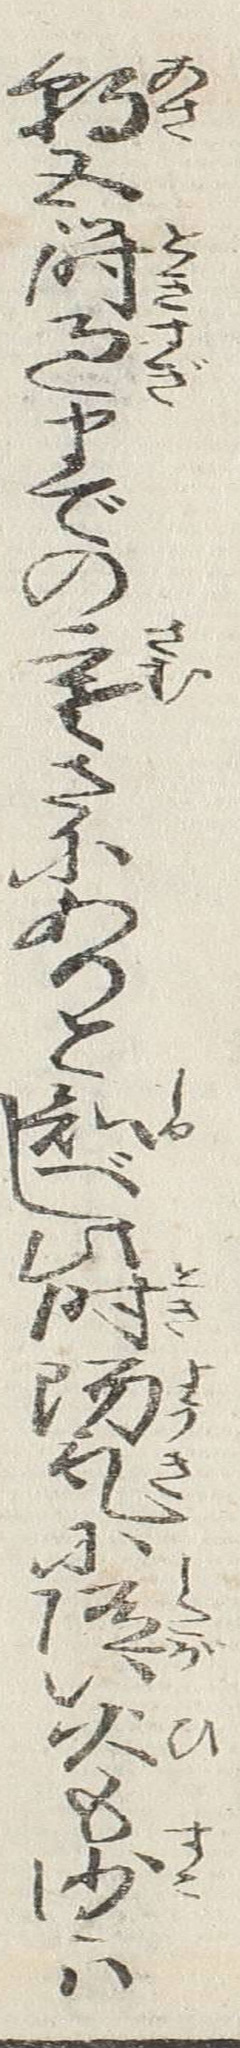朝五ッ時過までの寒さにありと知べし此時陽気に随い火も少しは
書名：養蠶實驗録
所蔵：東京大学農学生命科学図書館 国文学研究資料館
